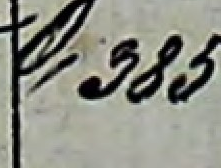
0,385
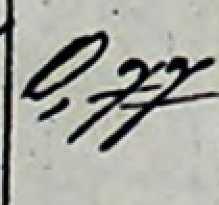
0,77
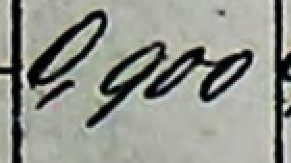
0,900
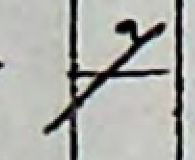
7
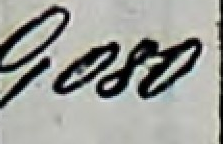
0,080
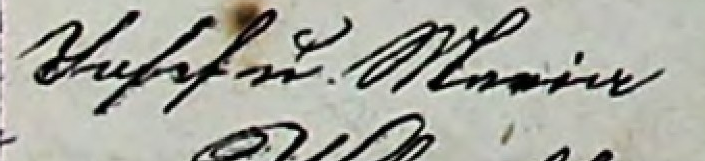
Josef u. Maria
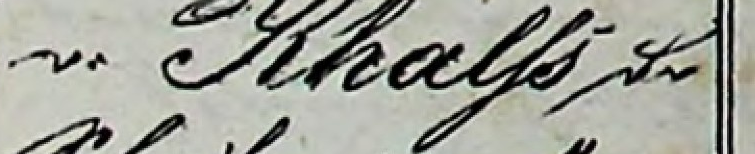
v. Khalhs v.
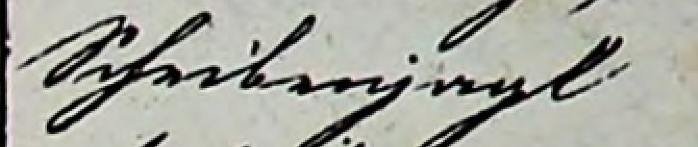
Scheibeigagl
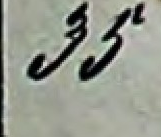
35
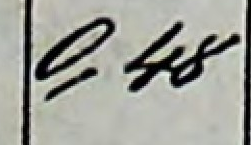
0,48
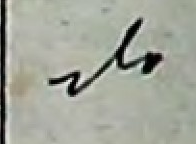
do
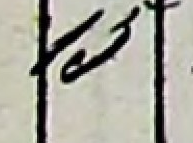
15
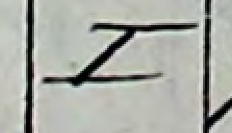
I
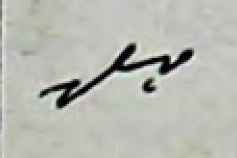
do
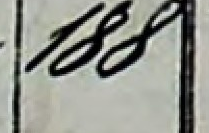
188
